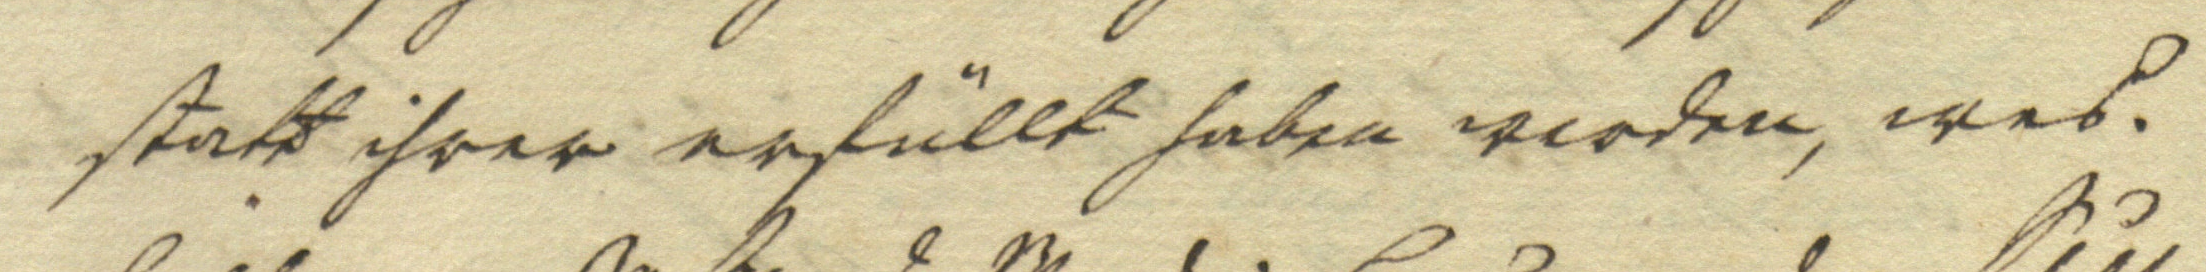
statt ihrer erfüllt haben werden, wes¬
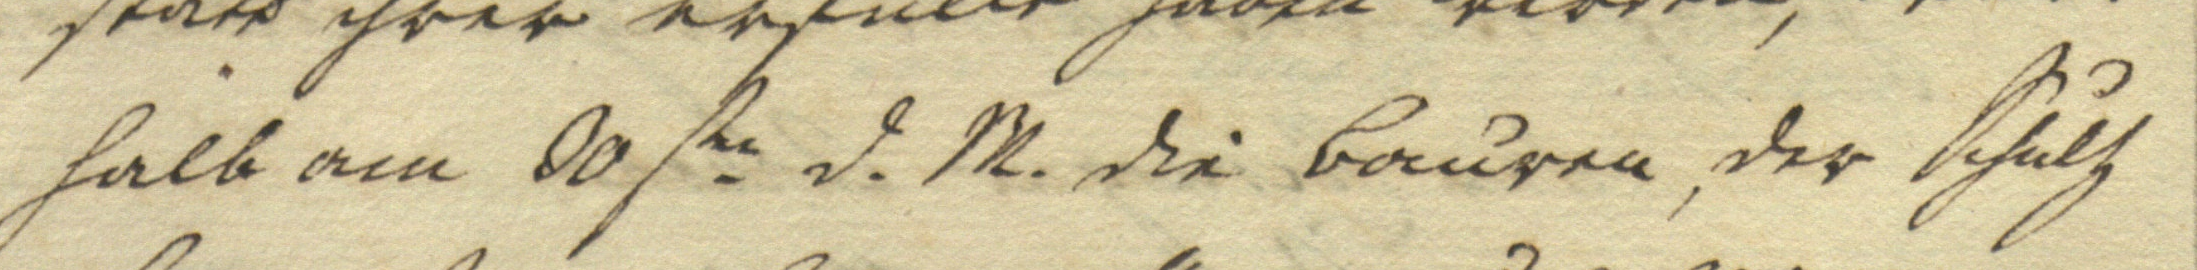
halb am 30 t. d. M. die Bauren, der Schulz
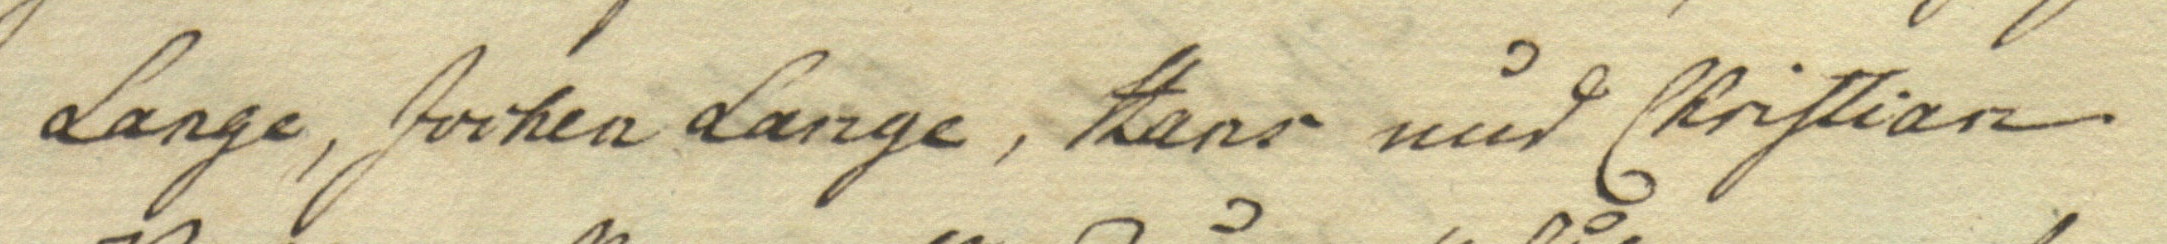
Lange, Jochen Lange, Hans und Christian
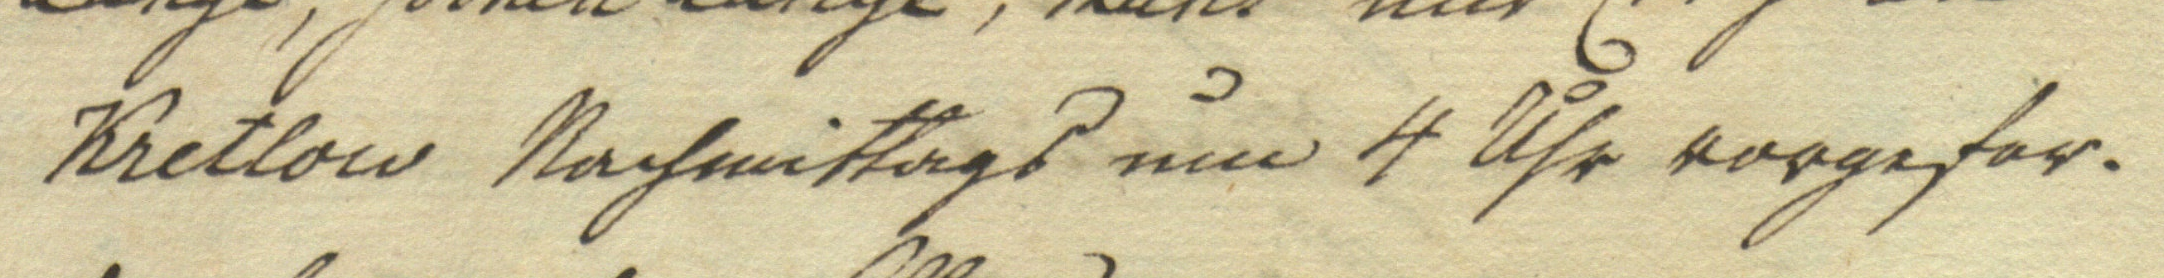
Kretlow Nachmittags um 4 Uhr vorgefor¬
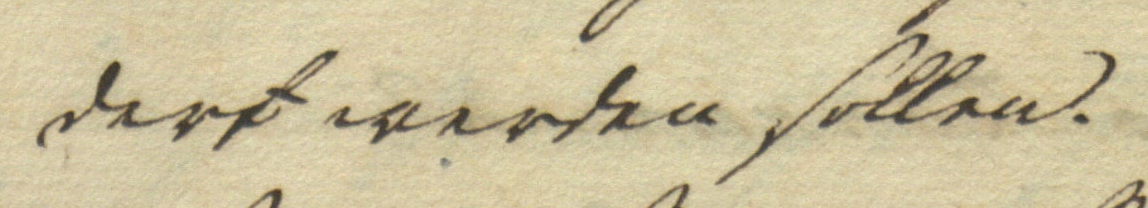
dert werden sollen.
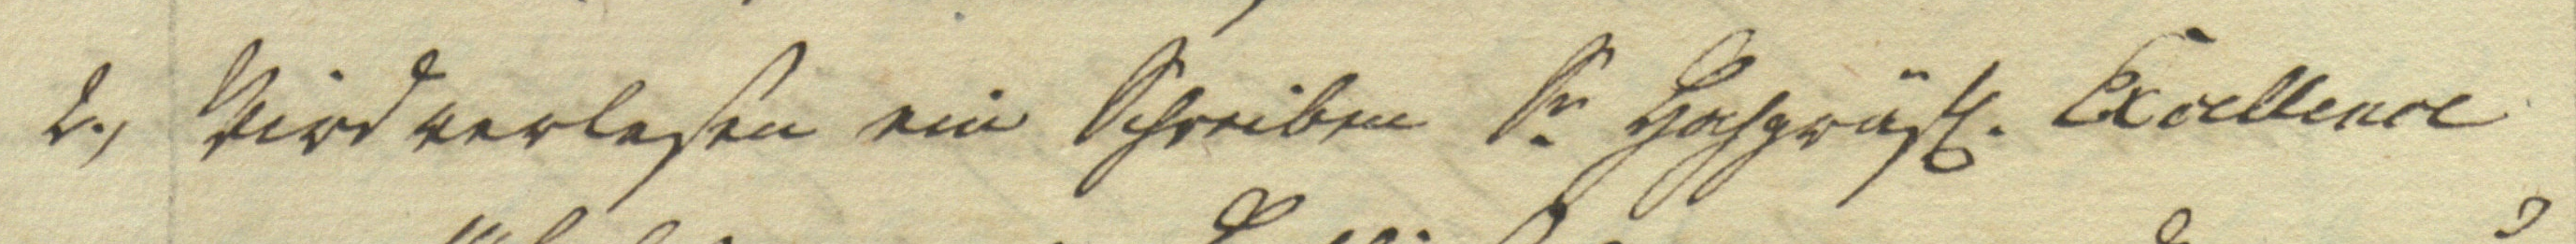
2., Wird verlesen ein Schreiben Sr Hochgräfl. Excellence
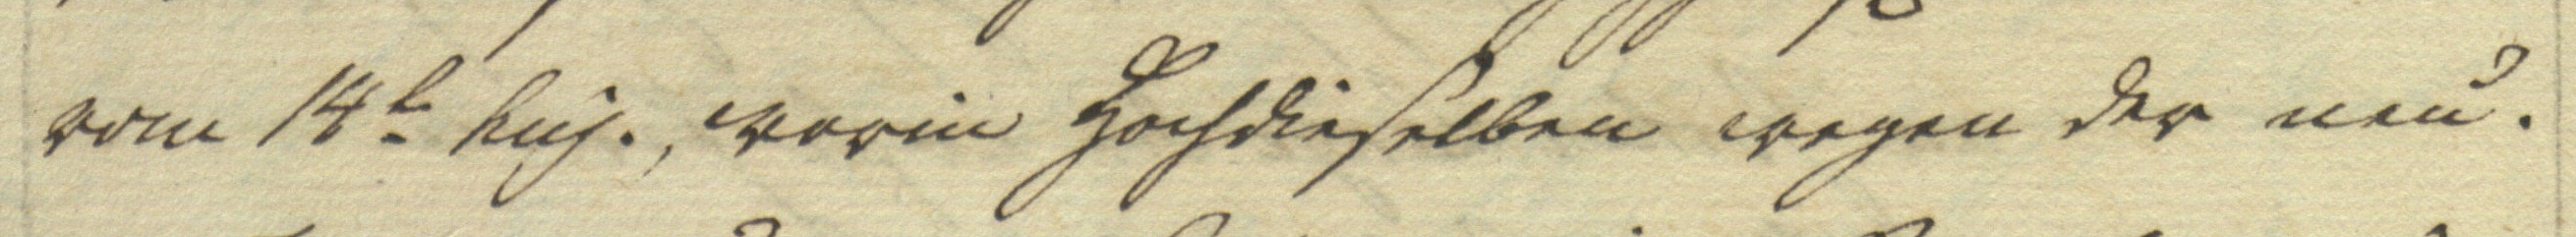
vom 14 t. huj. worin Hochdieselben wegen der neu¬
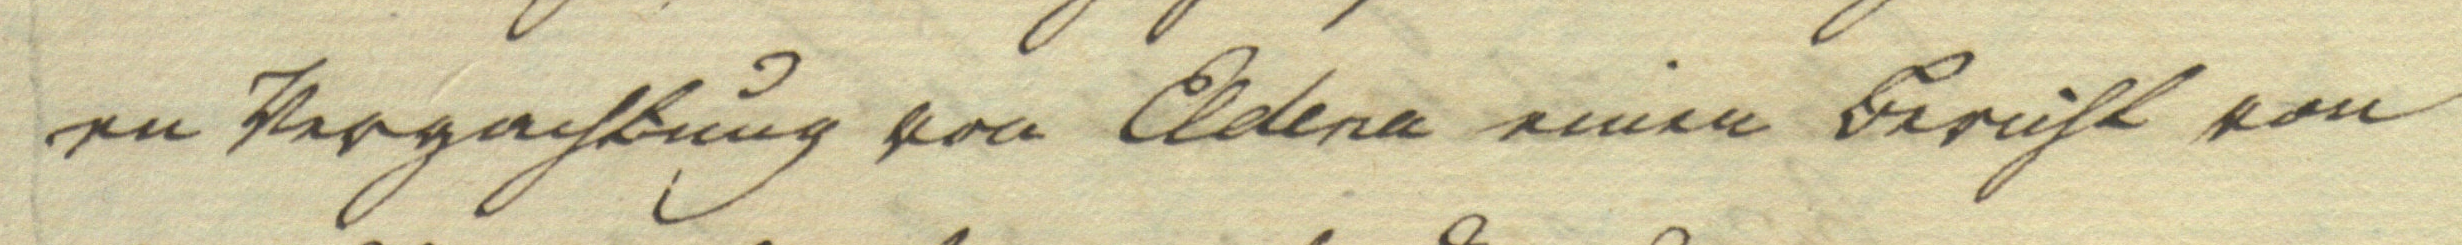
en Verpachtung von Eldena einen Bericht von
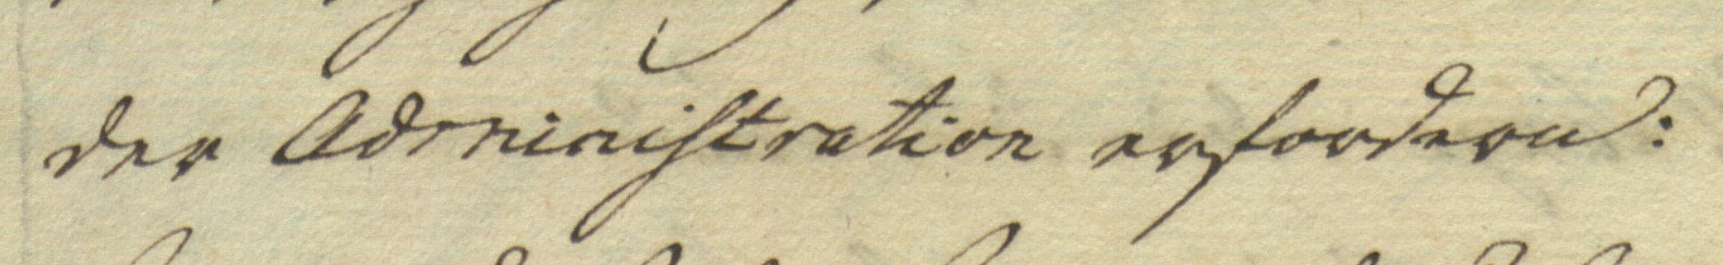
der Administration erfordern:
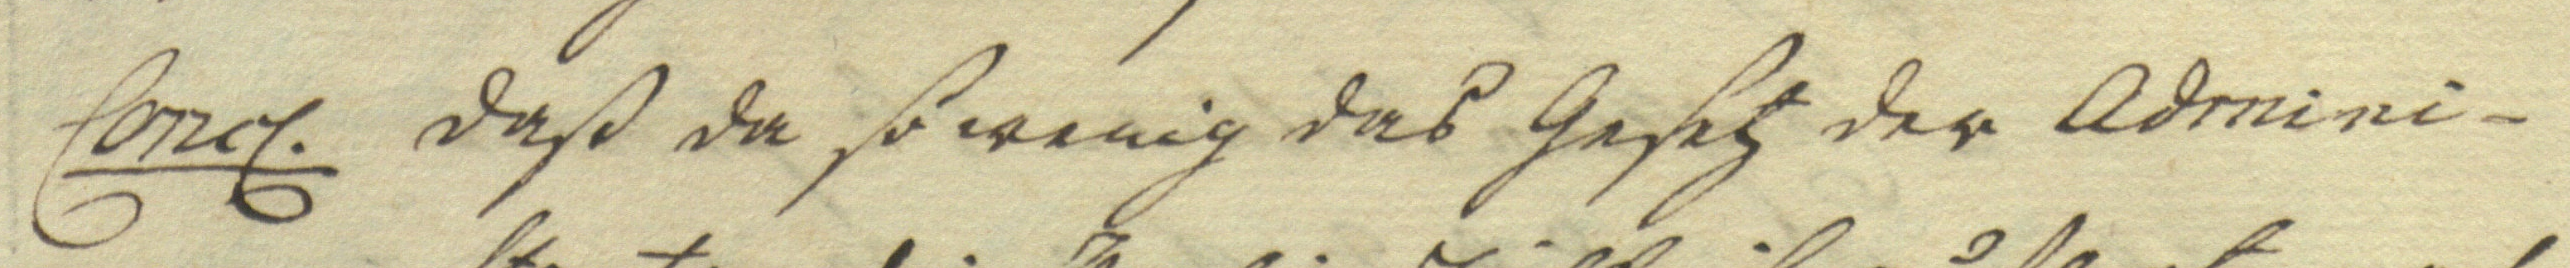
Concl. Daß da so wenig das Gesetz der Admini-
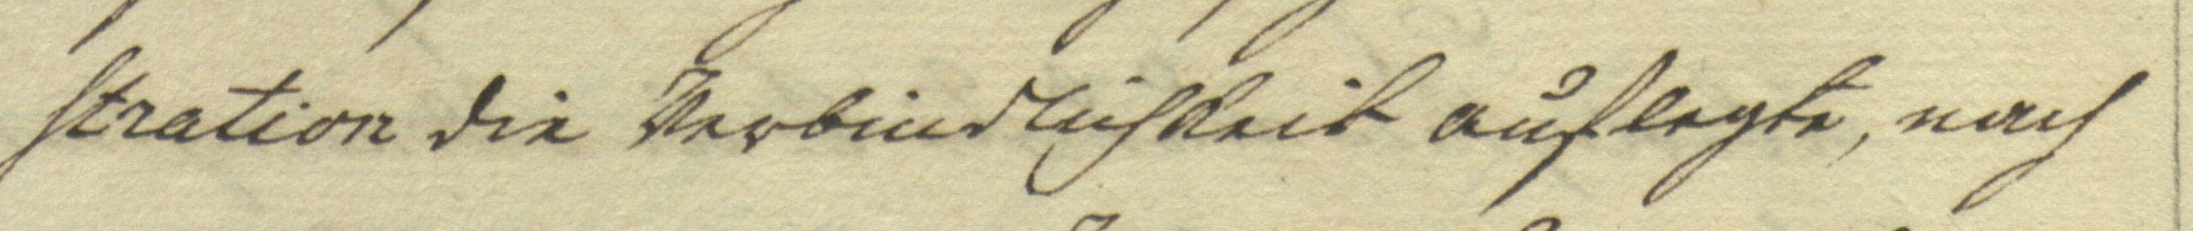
stration die Verbindlichkeit auflegte, nach
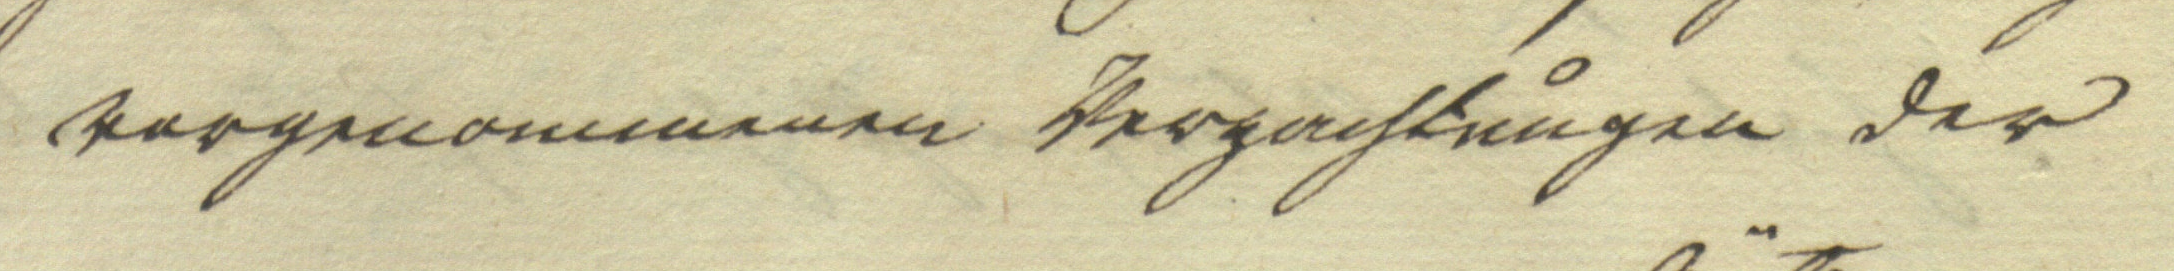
vorgenommenen Verpachtungen der
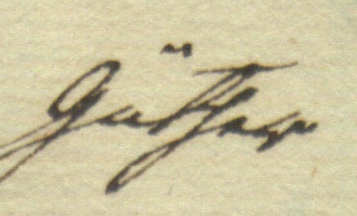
Güther
